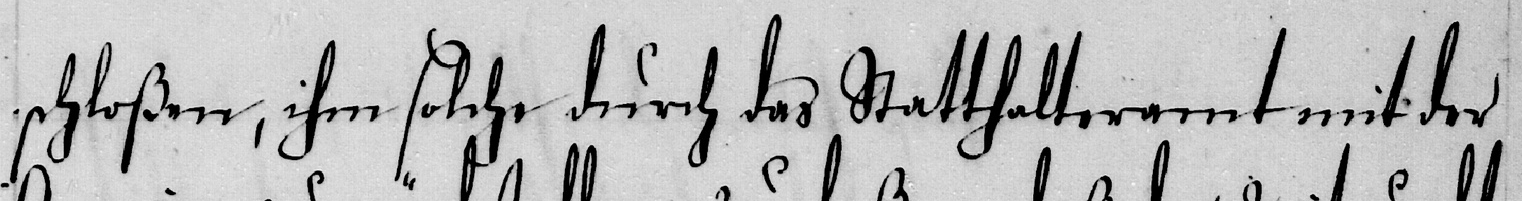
schloßen, ihm solche durch das Statthalteramt mit der
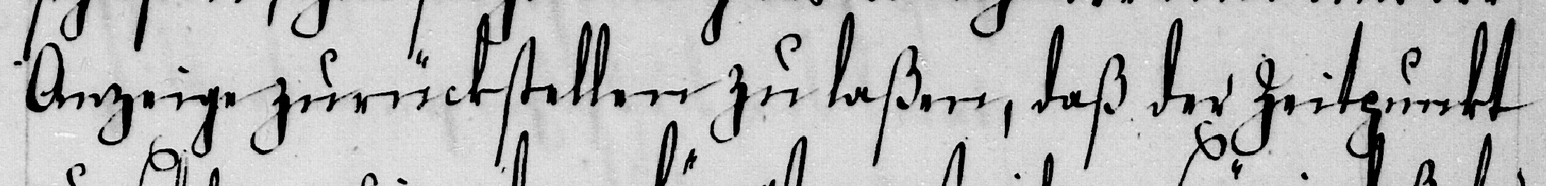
Anzeige zurückstellen zu laßen, daß der Zeitpunkt
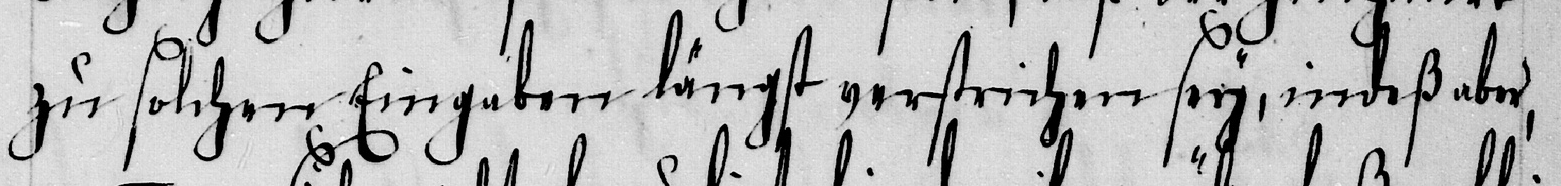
zu solchen Eingaben längst verstrichen sey, indeß aber
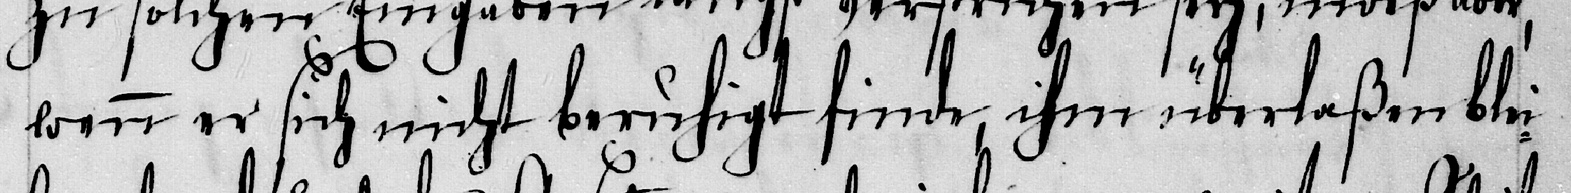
wenn er sich nicht beruhigt finde, ihm überlaßen blei¬
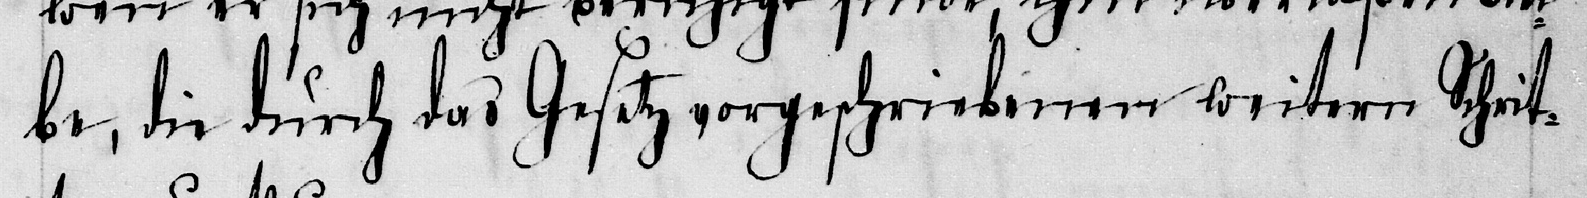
be, die durch das Gesetz vorgeschriebenen weitern Schrit¬
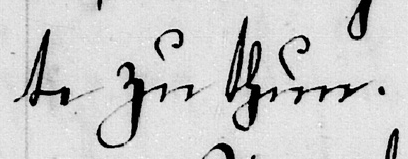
te zu thun.
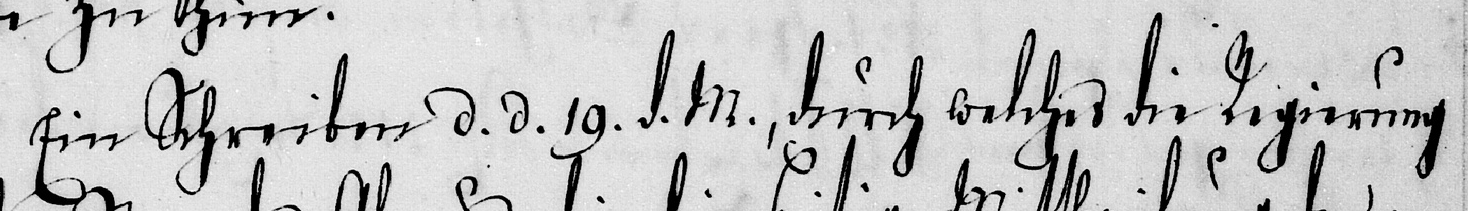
Ein Schreiben d. d. 19. d. M., durch welches die Regierung
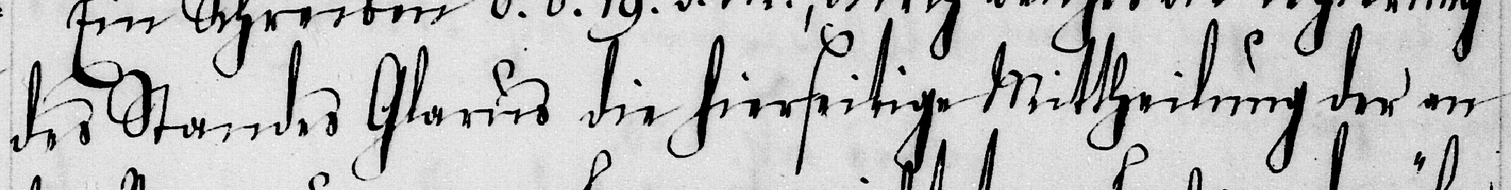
des Standes Glarus die hierseitige Mittheilung der an
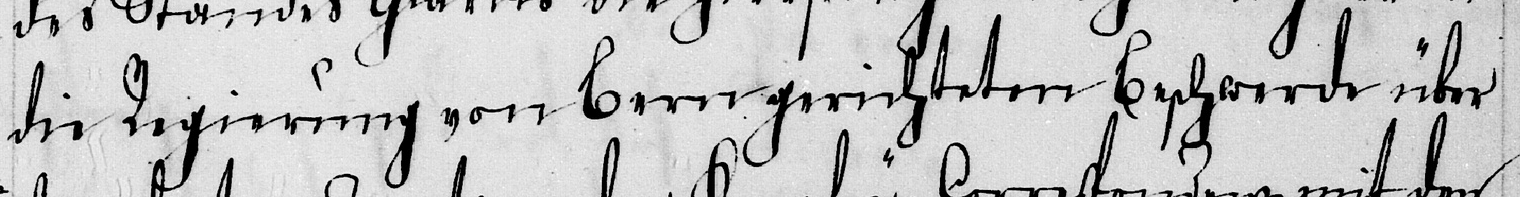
die Regierung von Bern gerichteten Beschwerde über
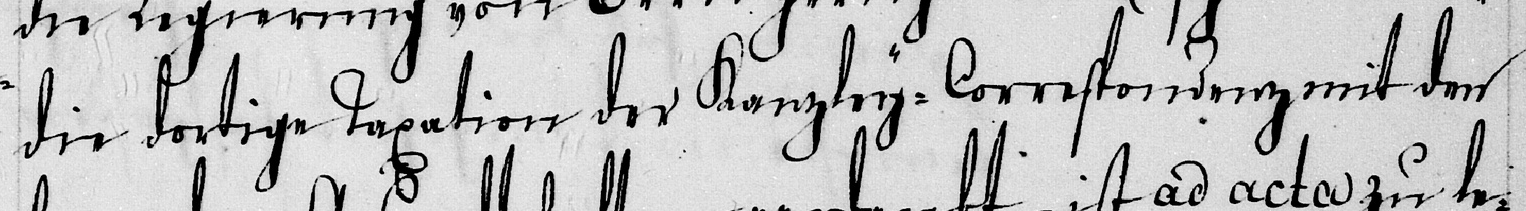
die dortige Taxation der Kanzley-Correspondenz mit den
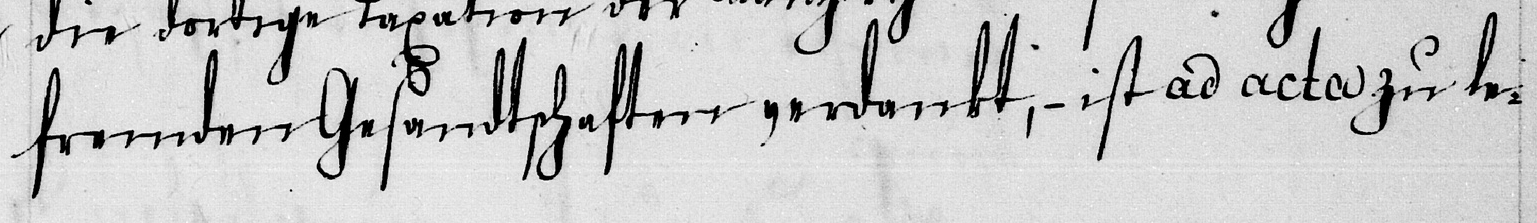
fremden Gesandtschaften verdankt, – ist ad acta zu le¬
